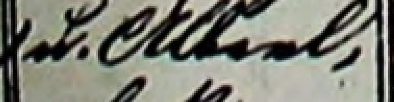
L. Alberl,
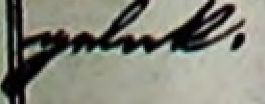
gelak.
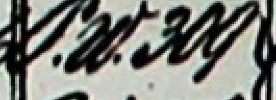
P.W. 309
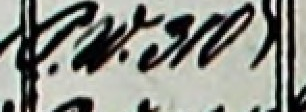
P.W. 310
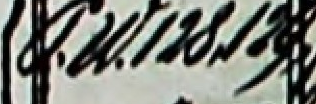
P.W. 128, 129,
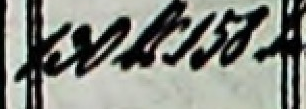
130 ks 158
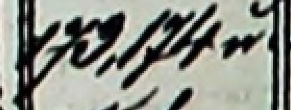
173, 174 u
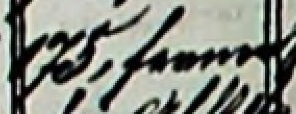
175, ferner
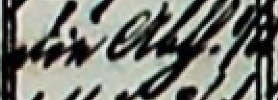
die Abth. 1/a
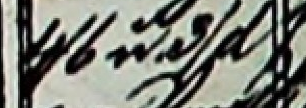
4/b u 3/d
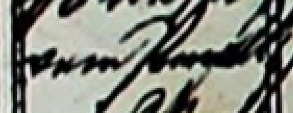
von Preßl„
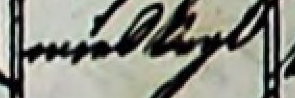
wirs kogl
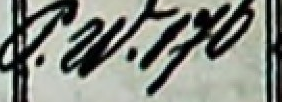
P.W. 176
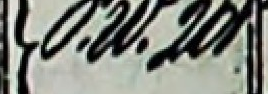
P.W. 201
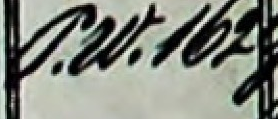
P.W. 162
